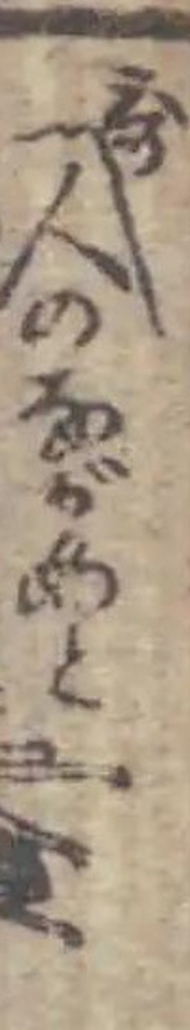〽人のながめと
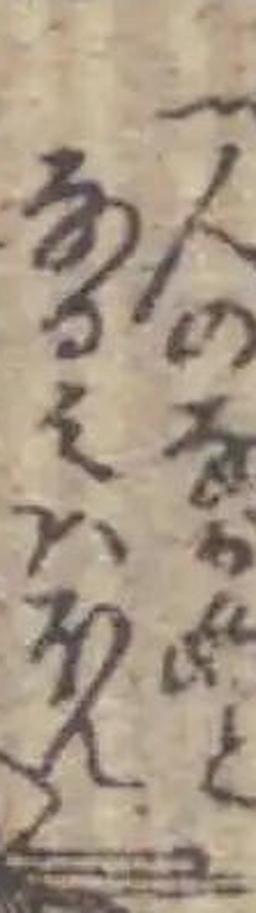なるみはほん
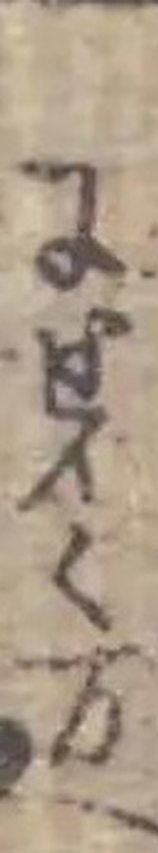にせんく万
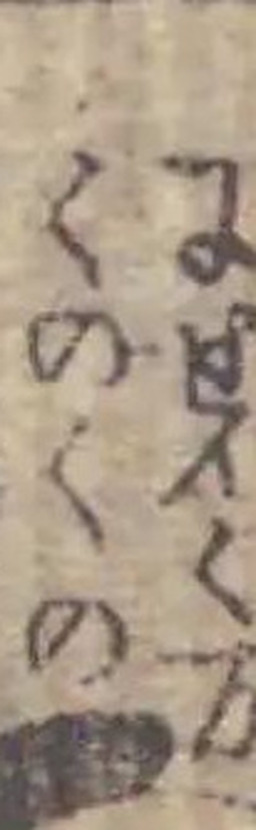くのくの
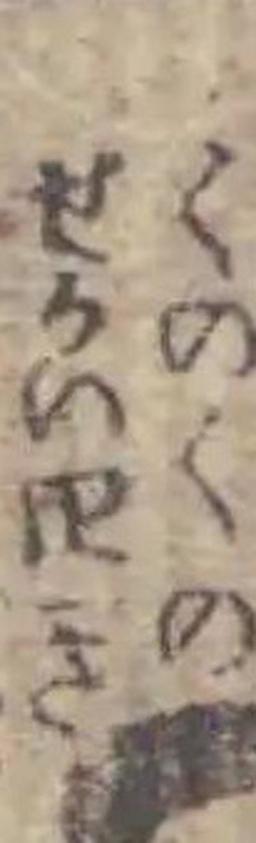せかい四き
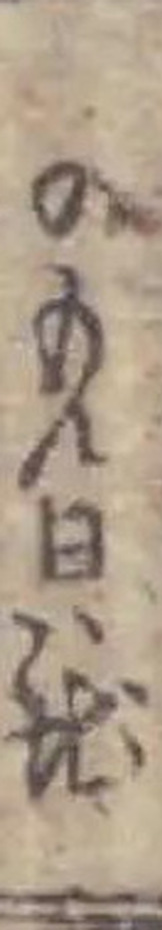のもん日は地
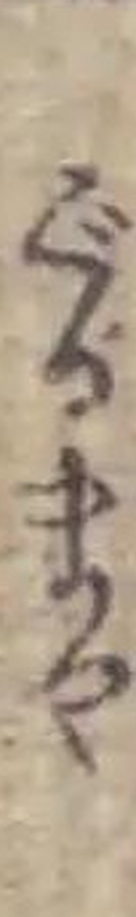ぐるまや
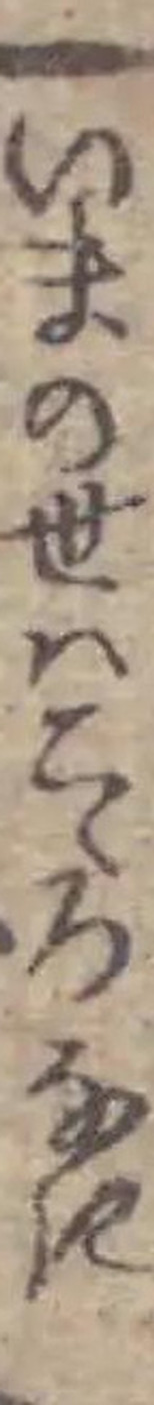いまの世はこゝろなき
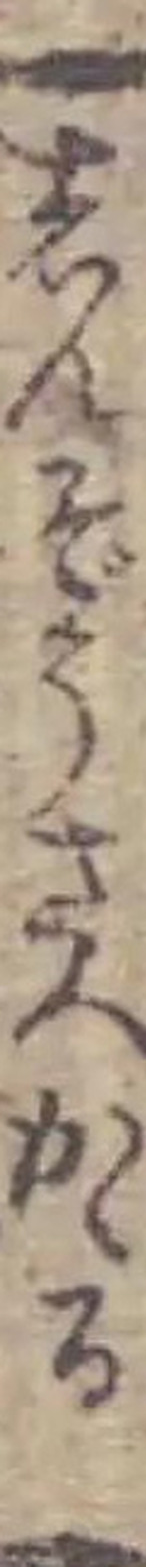しんぞうさへかゝる
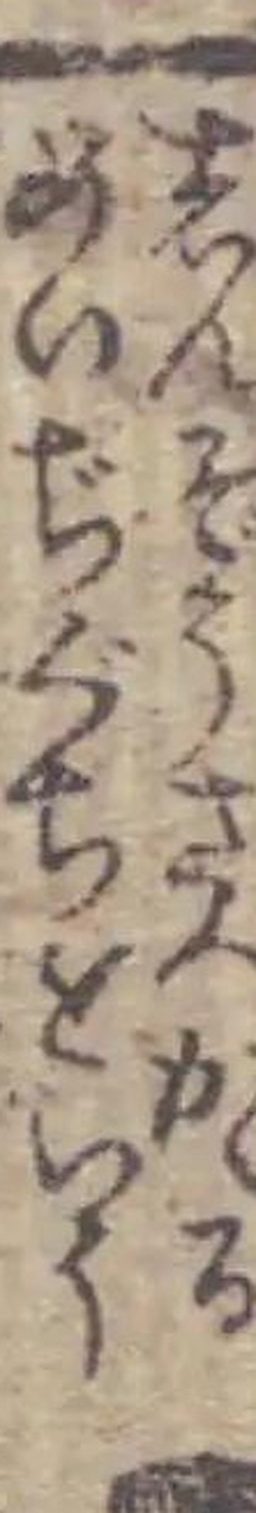めいぢぐちをいう
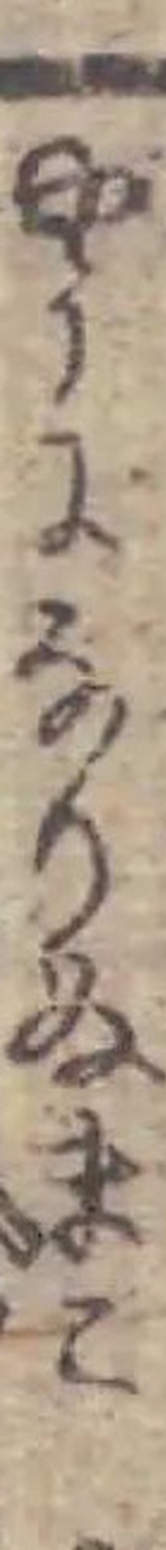やうになりぬまこ
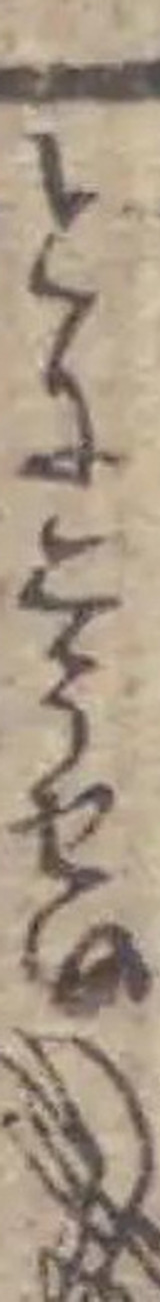とにこうせい
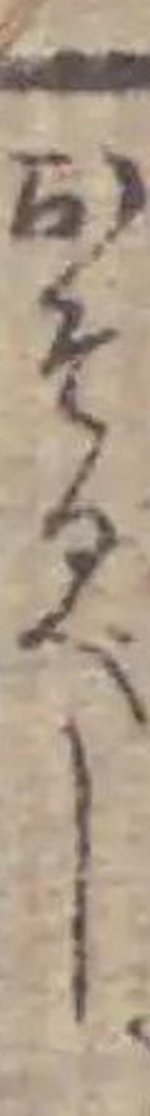おそるべし

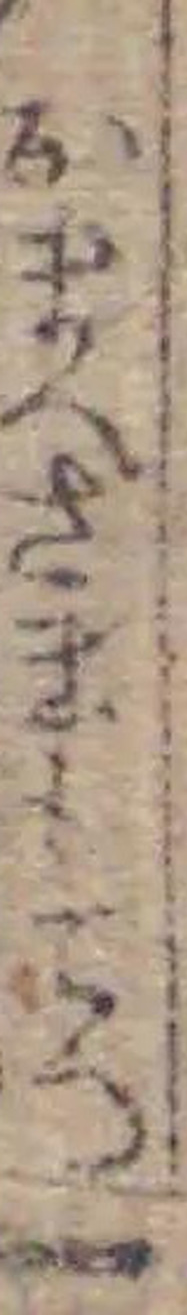おまへさまもてつ
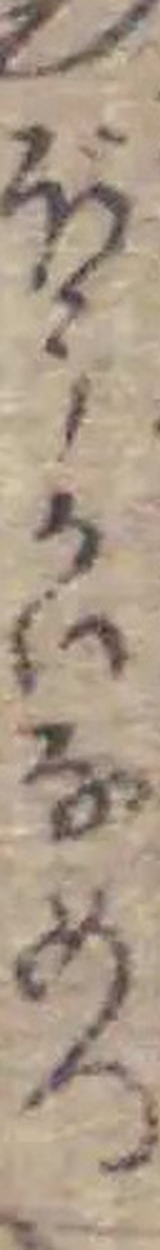ぼうかいなめつ
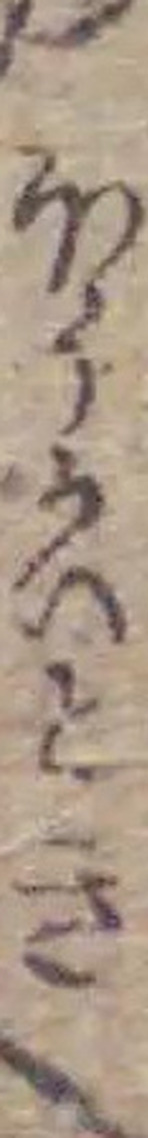ほうかいとき
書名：色男其処此処 3巻
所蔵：国立国会図書館 National Diet Library, JAPAN
